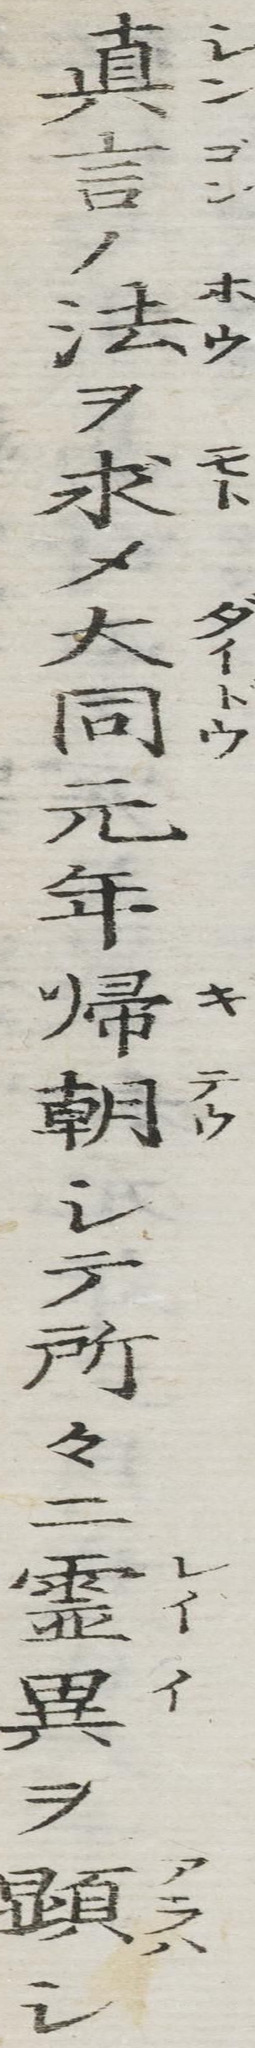真言ノ法ヲ求メ大同元年帰朝シテ所々ニ霊異ヲ顕シ

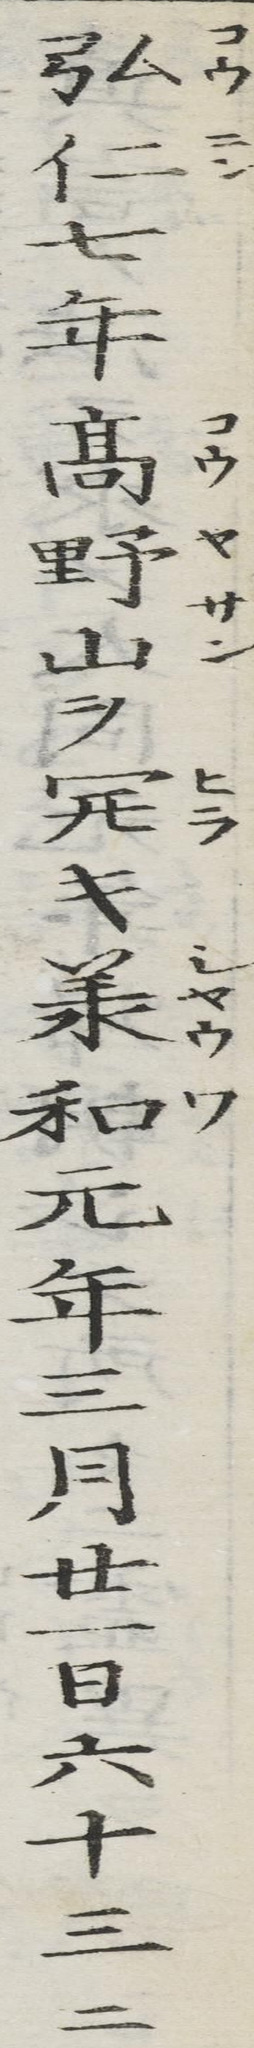弘仁七年高野山ヲ開キ承和元年三月廿一日六十三ニ
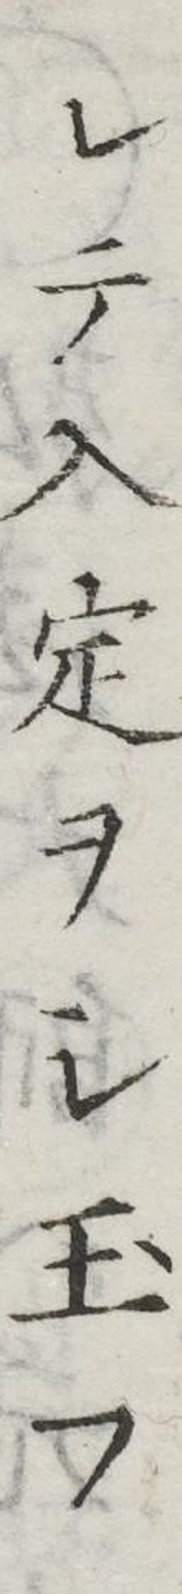シテ入定ヲシ玉フ
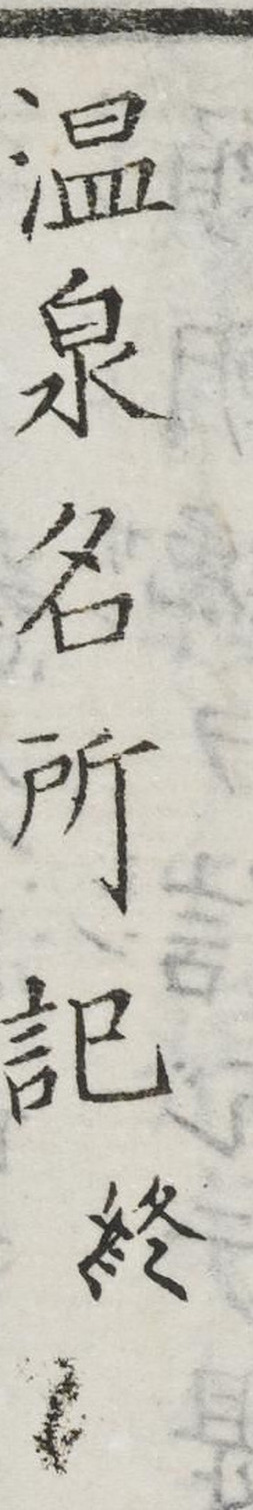温泉名所記終
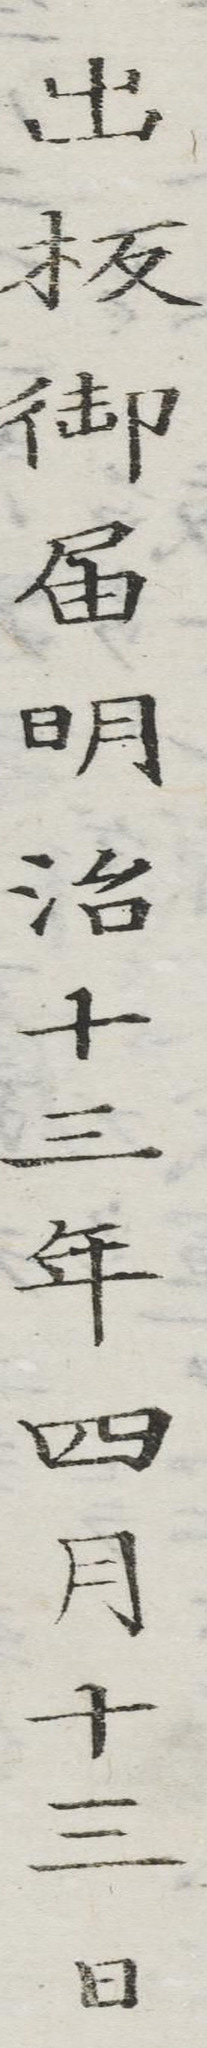出板御届明治十三年四月十三日
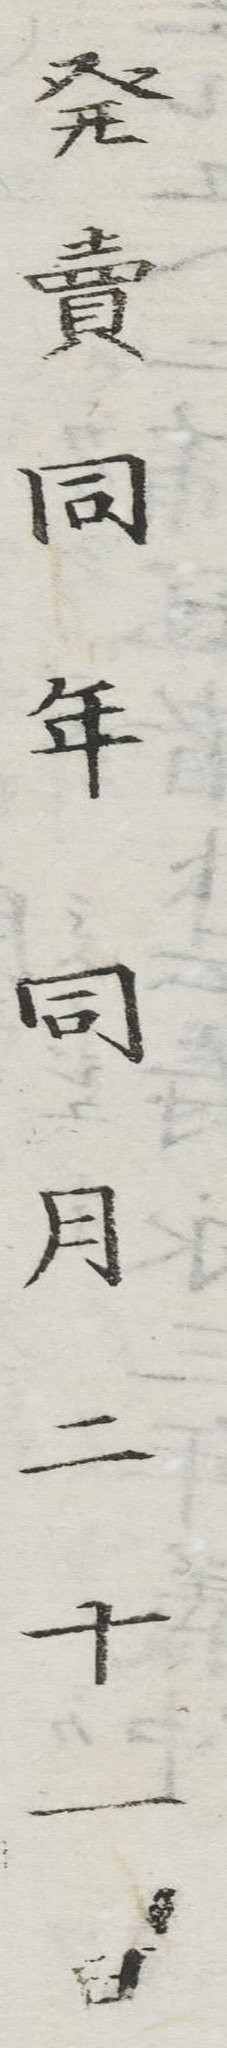発賣同年同月二十一日
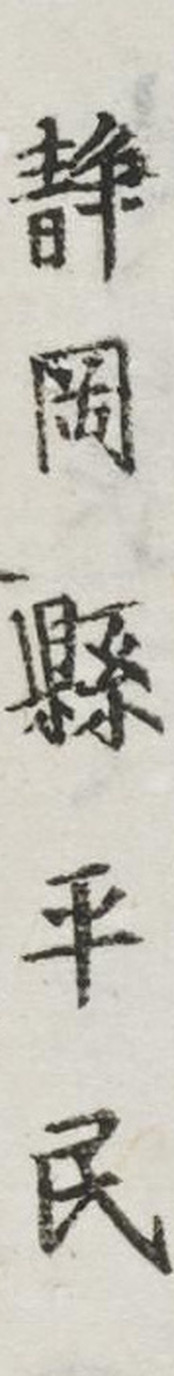静岡縣平民
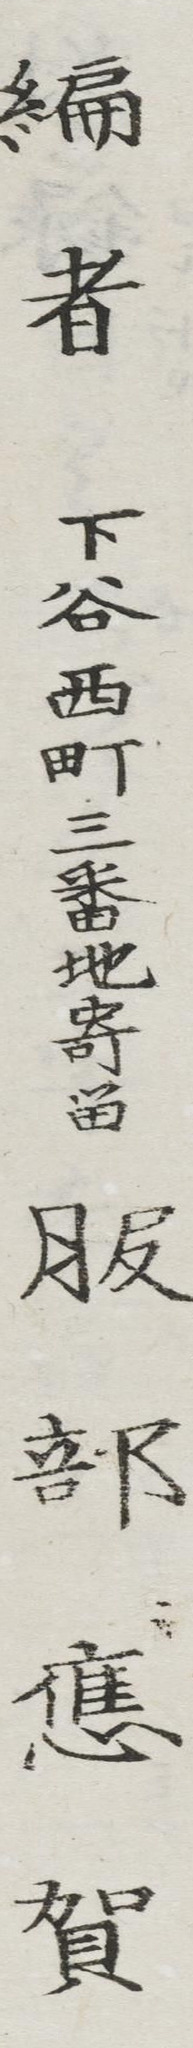編者下谷西町三番地寄畄服部應賀
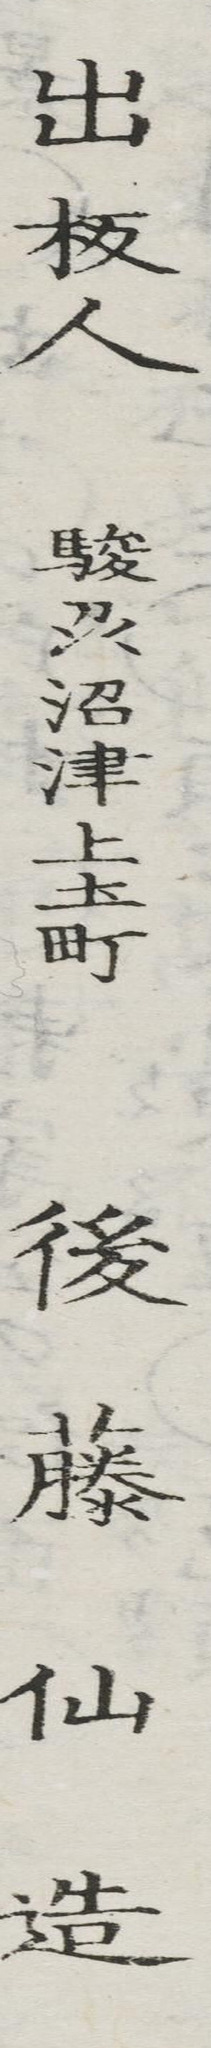出板人駿州沼津上圡町後藤仙造
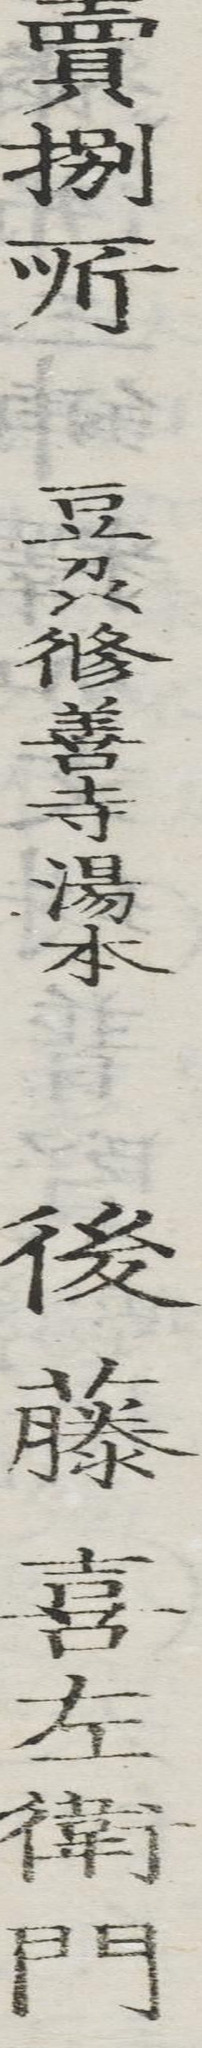賣捌所豆州修善寺湯本後藤喜左衛門
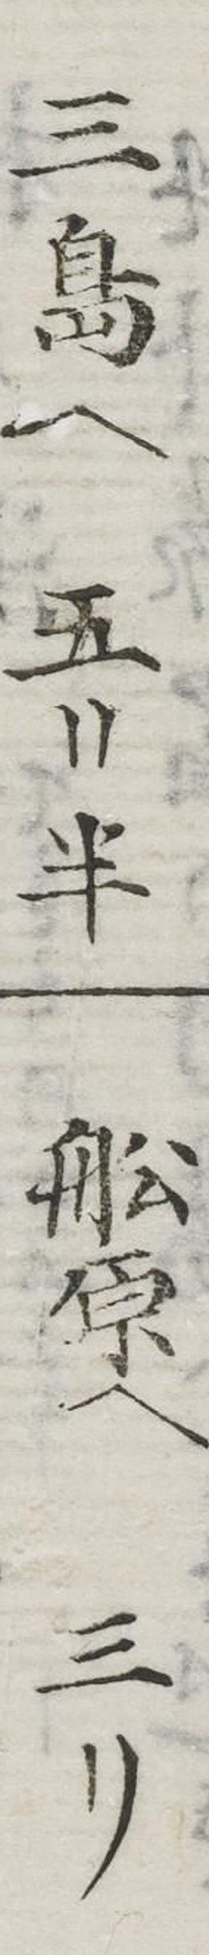三島へ五リ半舩原へ三リ
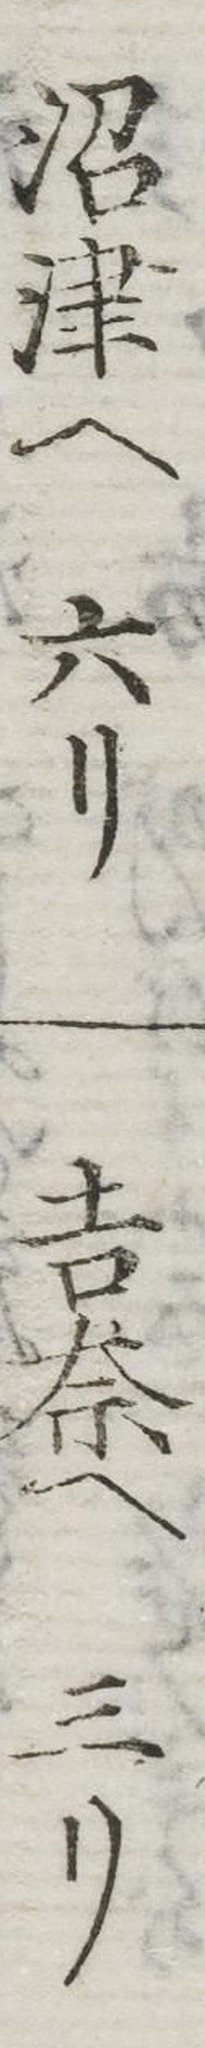沼津へ六リ𠮷奈へ三リ
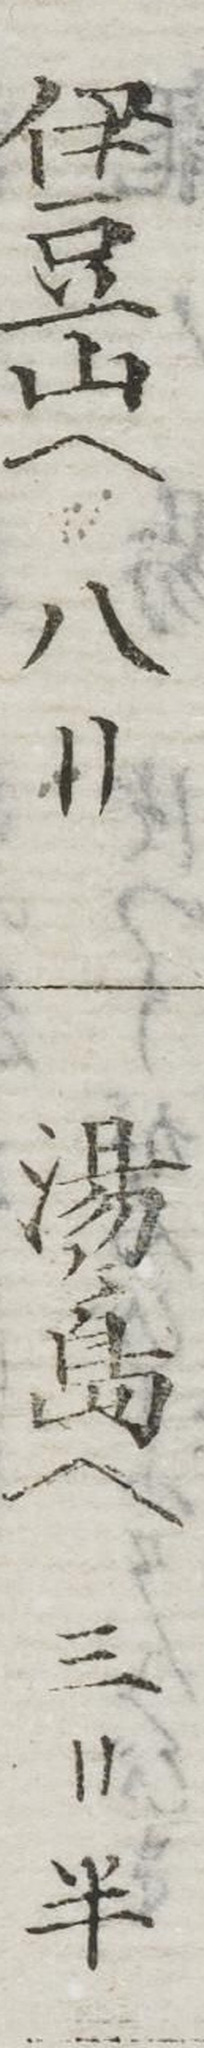伊豆山へ八リ湯ノ島へ三リ半
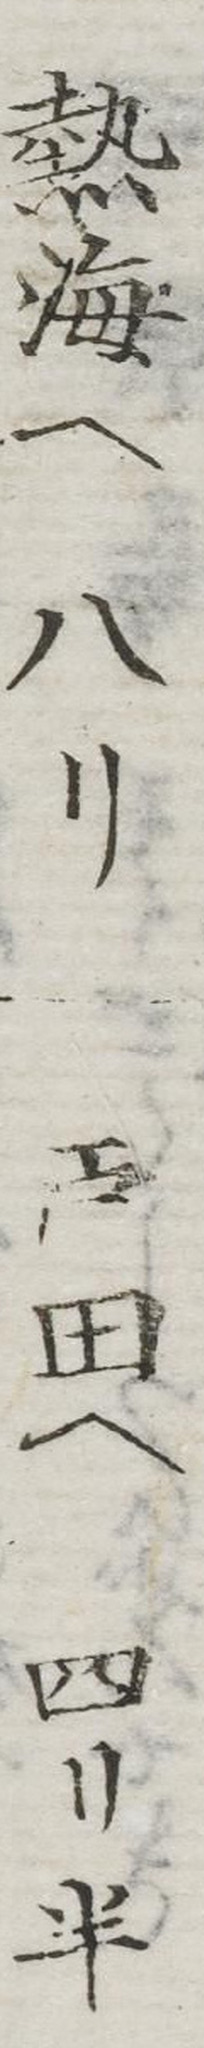熱海へ八リ戸田へ四リ半
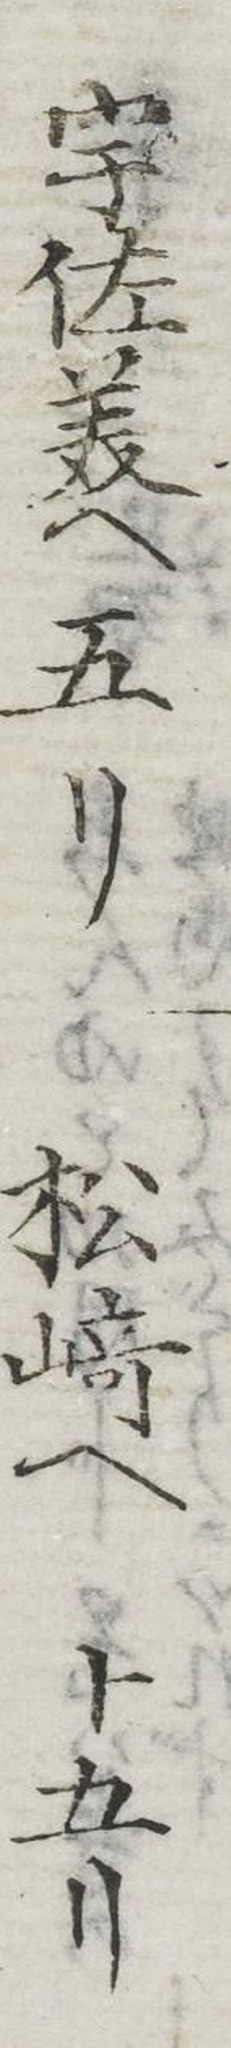宇佐美へ五リ松崎へ十五リ
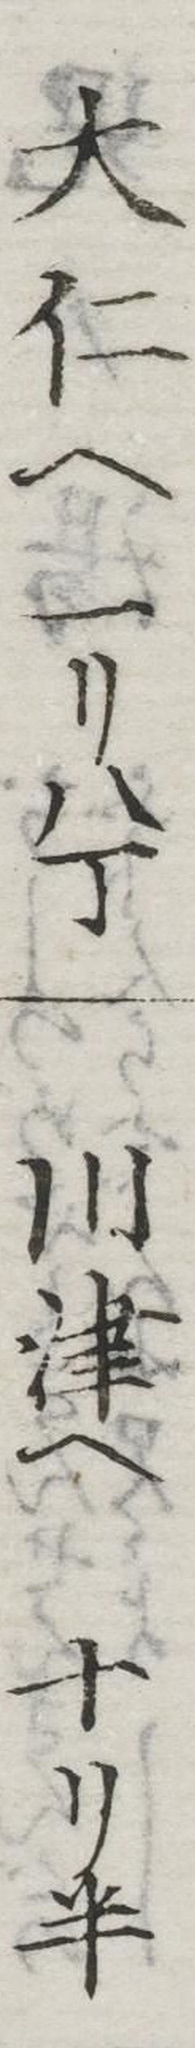大仁へ一リ八丁川津へ十リ半
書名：伊豆国修善寺温泉名所記　全
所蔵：東京大学地震研究所図書室 Earthquake Research Institute Library, The University of Tokyo, JAPAN
